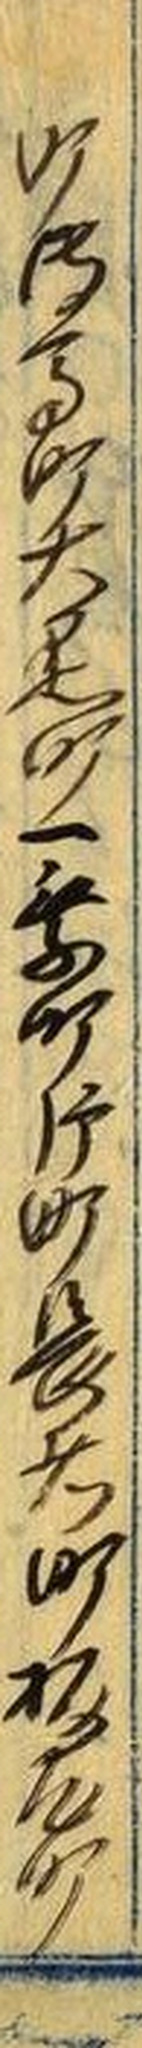町伝馬町大黒町一乗町片町長者町板屋町
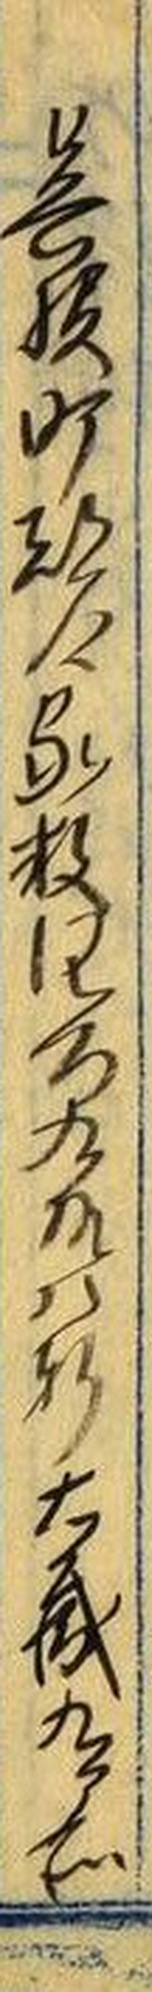呉服町都合家数四百九拾八棟右蔵九ヶ所

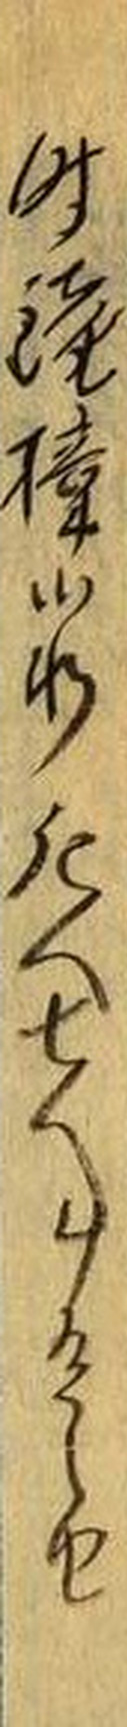時鐘撞弐軒死人七人計有之由
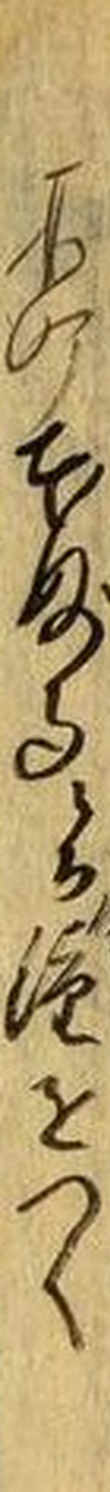木町本妙寺に而時鐘をつく
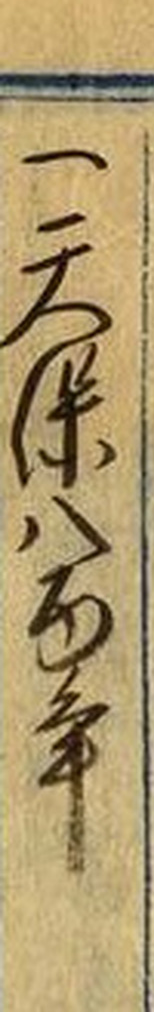一天保八酉年
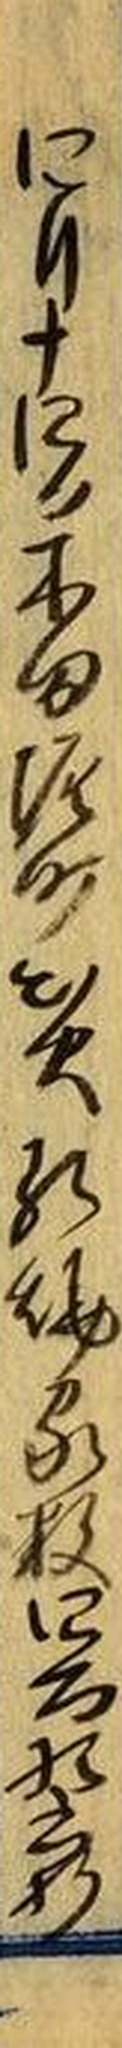四月十四日木田堀町出火類焼家数四百拾六軒
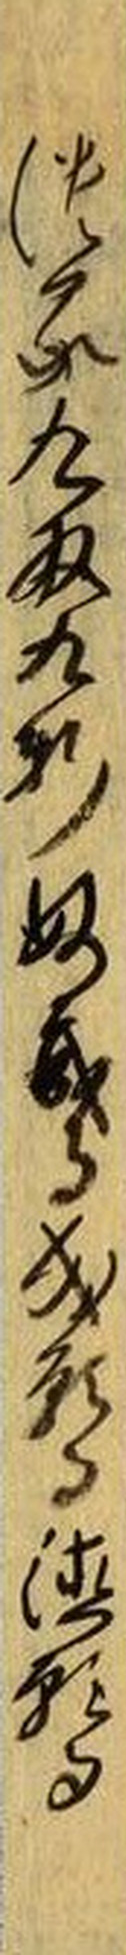潰家九拾九軒妙蔵寺成願寺徳願寺
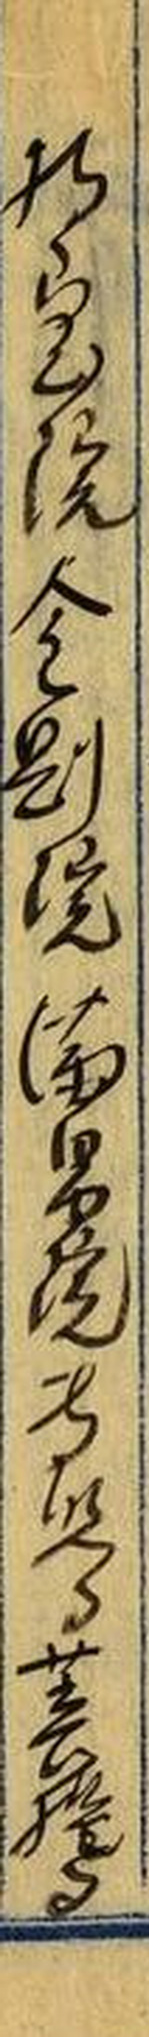持宝院金剛院満昌院専照寺菩提寺
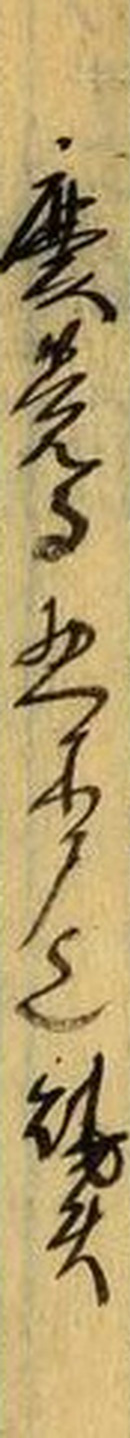慶覚寺惣木戸迄焼失
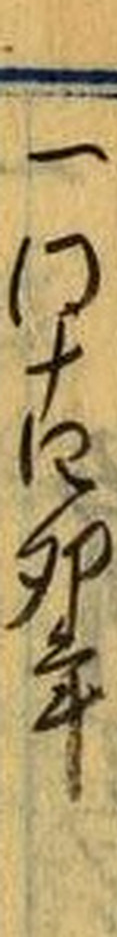一同十四卯年
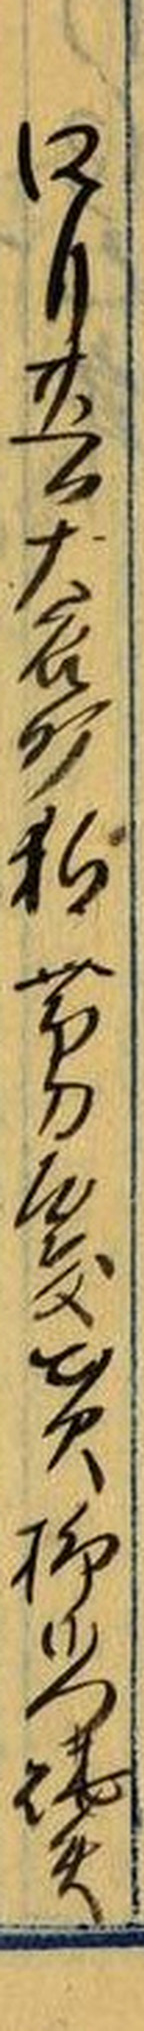四月廿一日大名町狛帯刀屋敷出火柳御門焼失
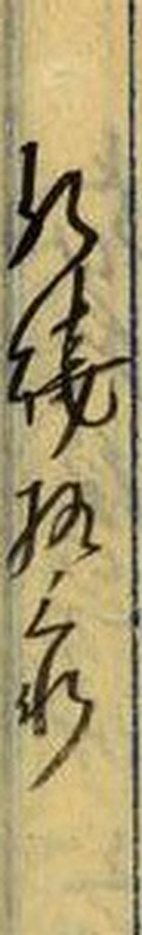類焼拾三軒
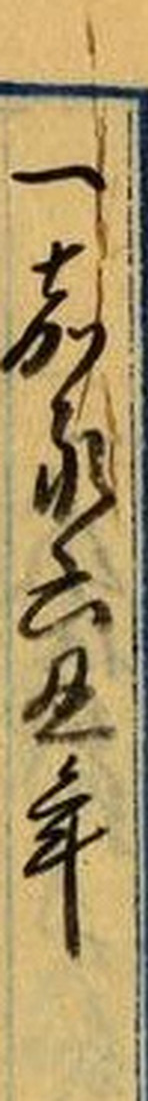一嘉永六丑年
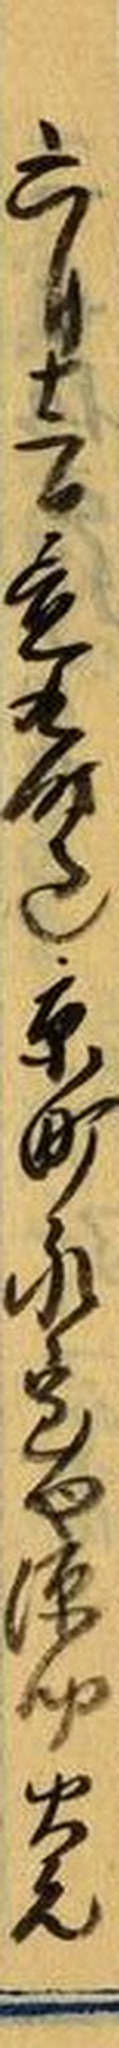六月十二日昼九時過京町永宝や源助火元
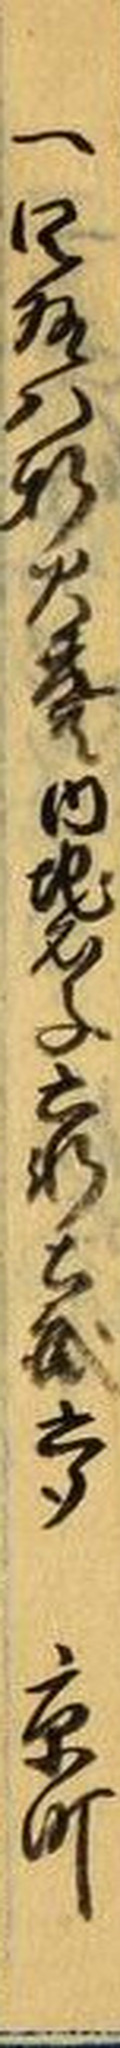一四拾八軒火元共内地名子六軒土蔵六ッ京町
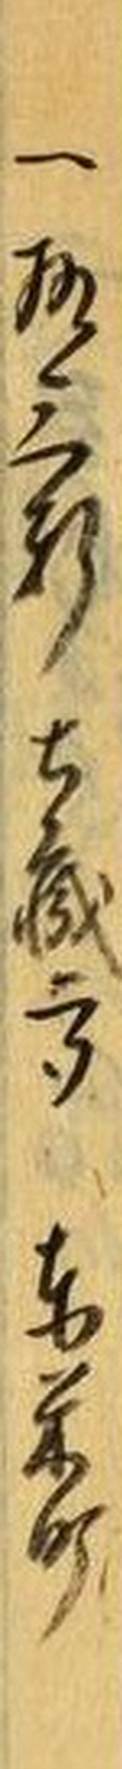一拾三軒土蔵二ッ東米町
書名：温古集 五巻
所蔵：福井県文書館 Fukui Prefectural Archives
